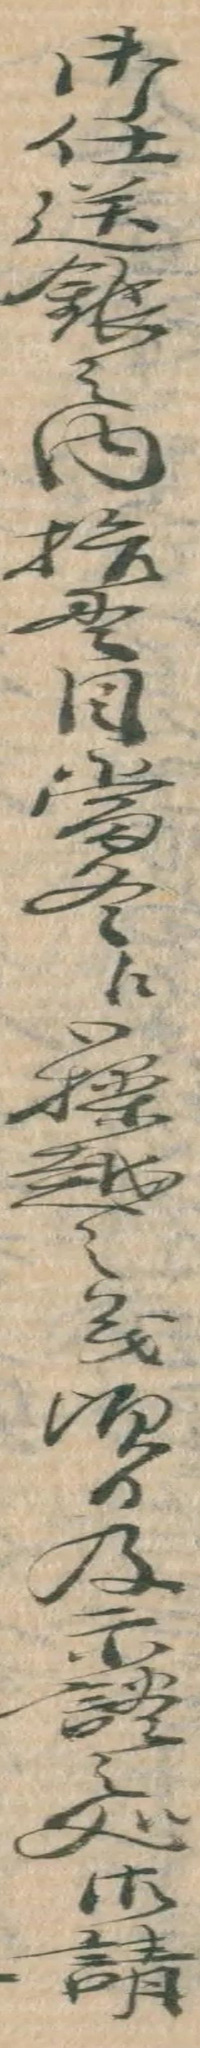御仕送銀之内拾貫目當冬江御操越之義頃日及示談之処御請
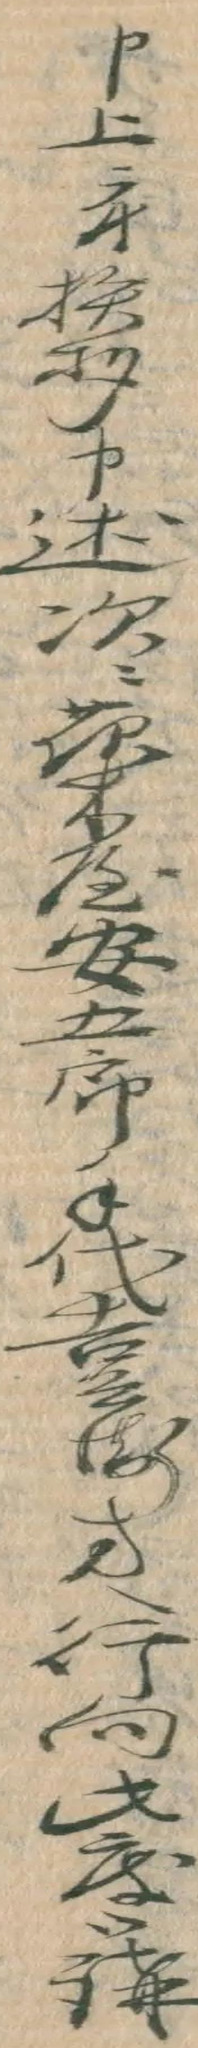申上ニ付挨拶申述次ニ茨木屋安五郎手代吉兵衛方へ行向此度御講
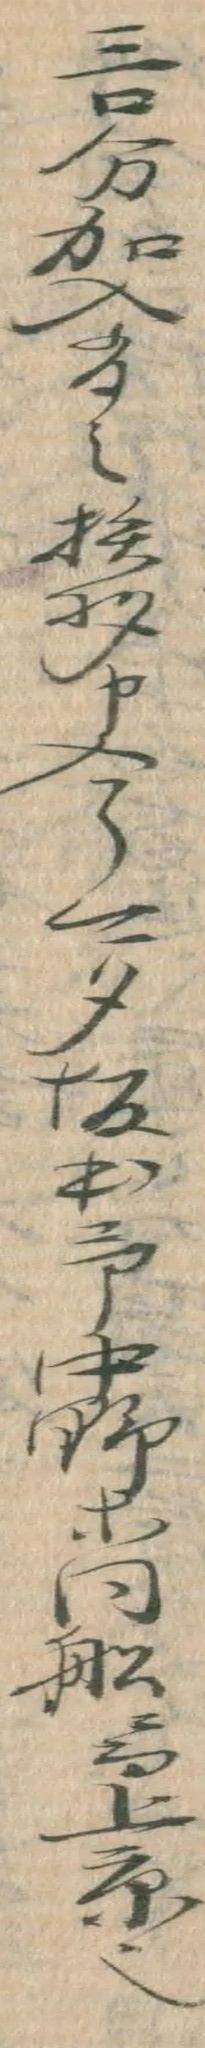三口分加入有之挨拶申入了今夕坂本予中野等同舩ニ而上京也
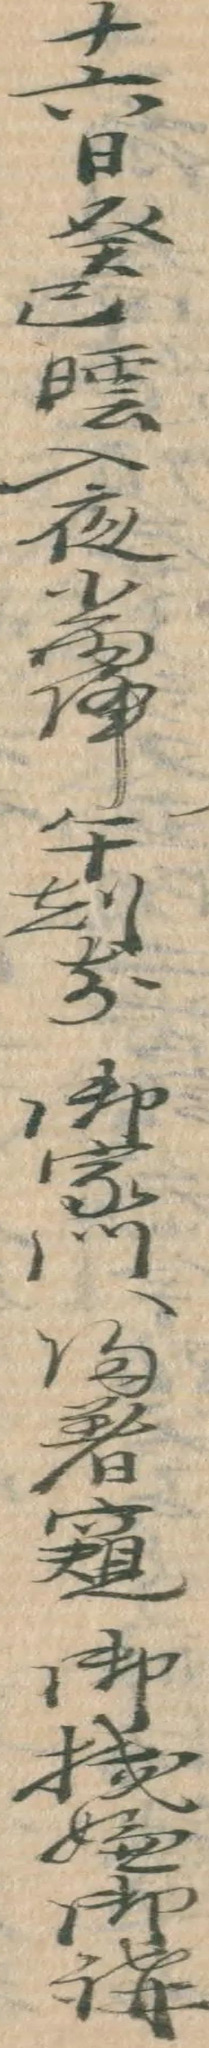十六日癸巳曇入夜小雨降午刻前御家門へ帰着窺御機嫌御講
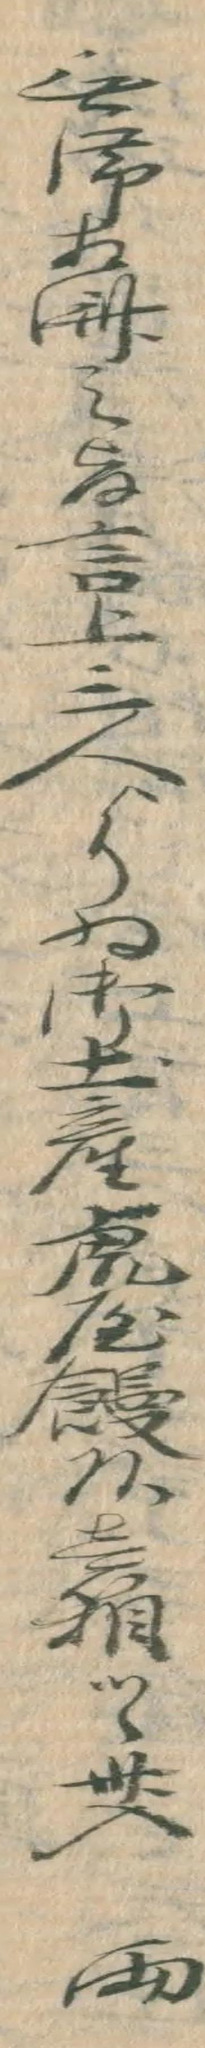無滞相済之旨言上三人より為御土産虎屋饅頭壱箱ツヽ卅入両
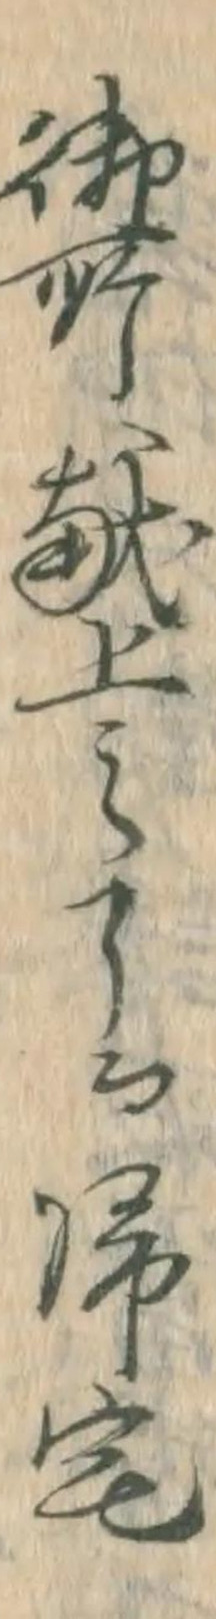御所へ献上之了而帰宅
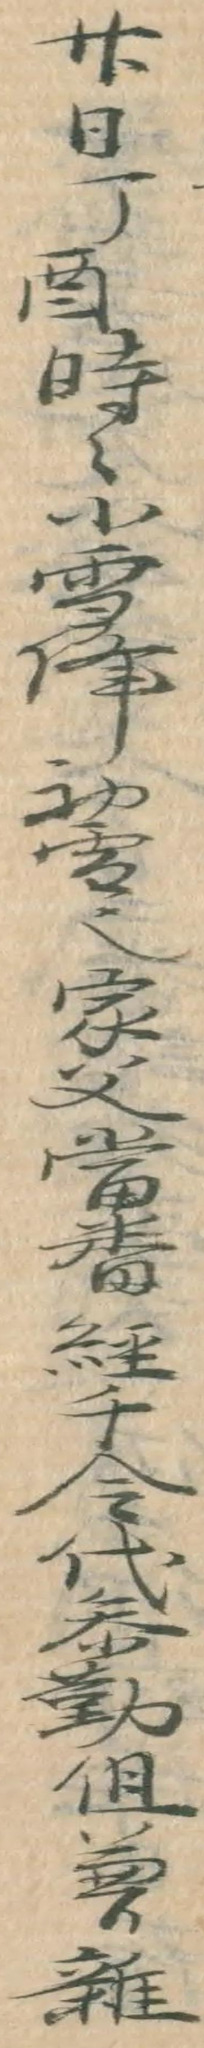廿日丁酉時〻小雪降初雪也家父當番経千令代参勤但兼日雑

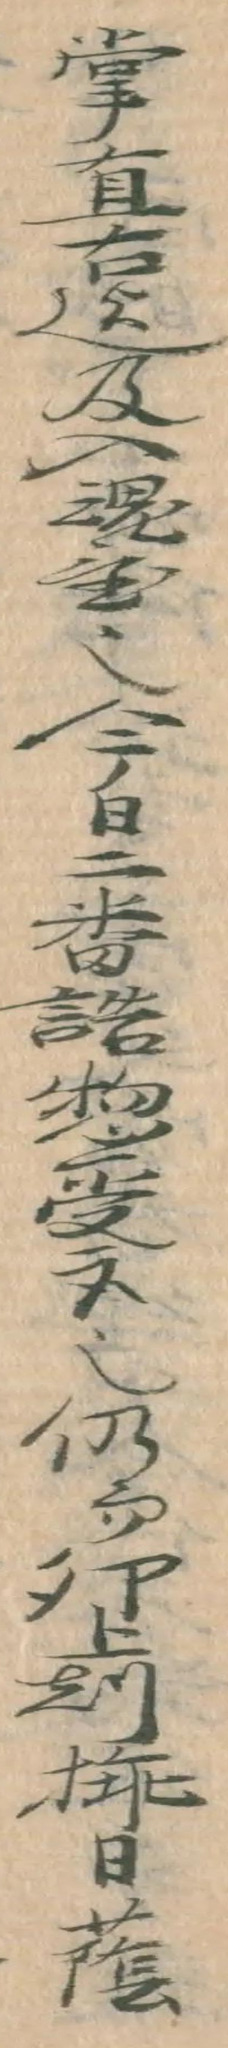掌直古迄及入魂置也今日二番詰惣受取也仍而卯上刻挿日蔭
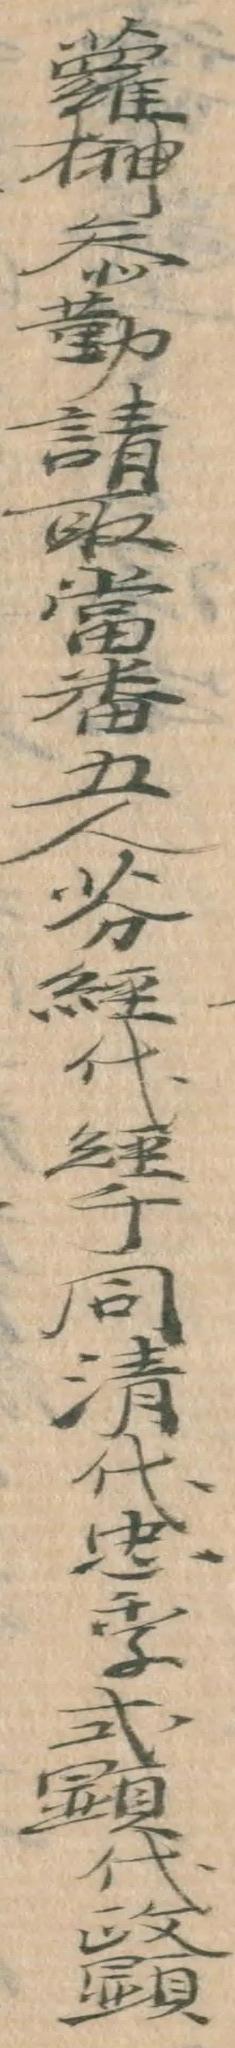蘿榊参勤請取當番五人芬経代経千同清代忠季式顕代政顕
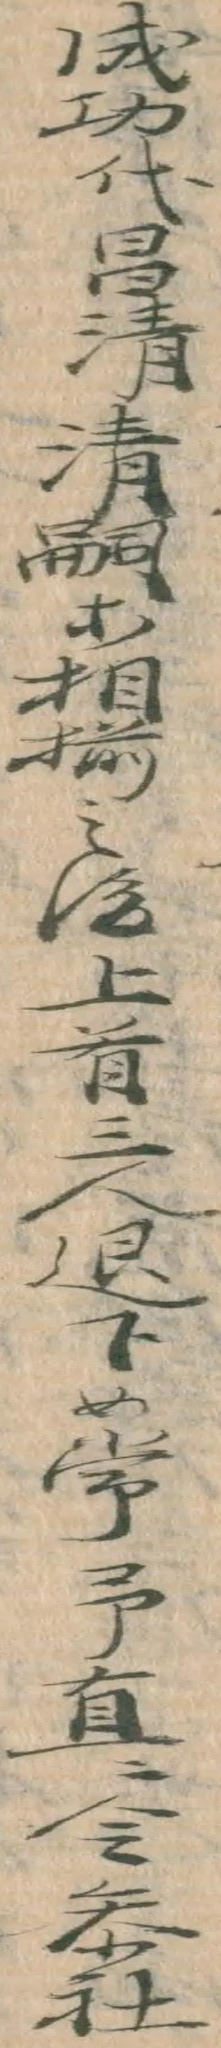成功代昌清清嗣等相揃之後上首三人退下如常予直ニ令参社
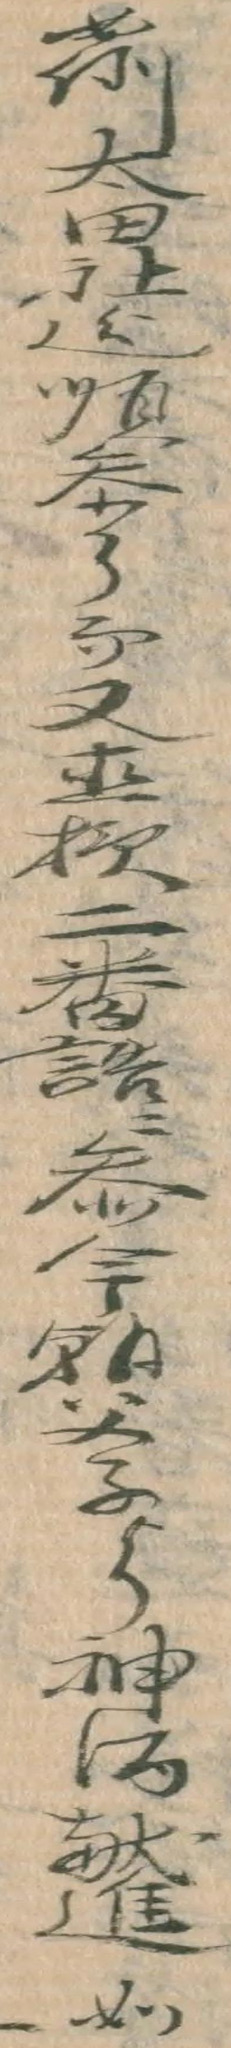如例太田社迄順参了而又直様二番詰ニ参今朝父子より神酒献進如
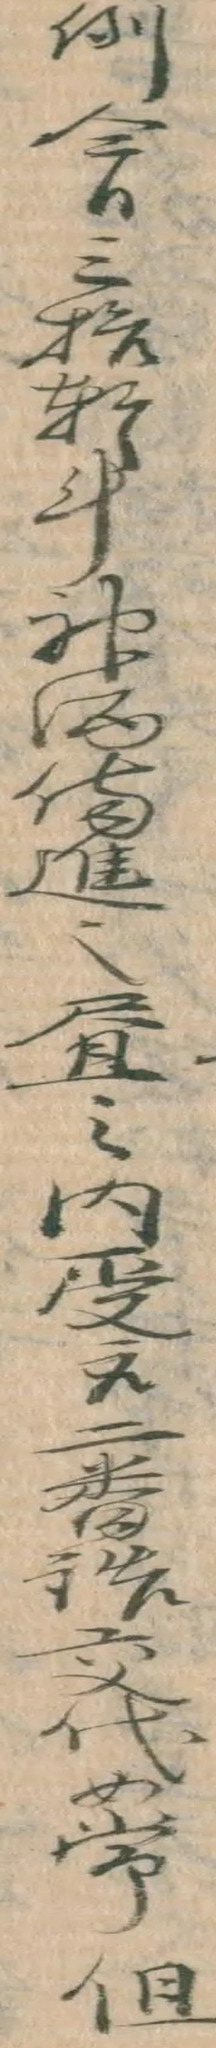例今日三拾軒斗神酒備進也昼之内受取二番詰交代如常但
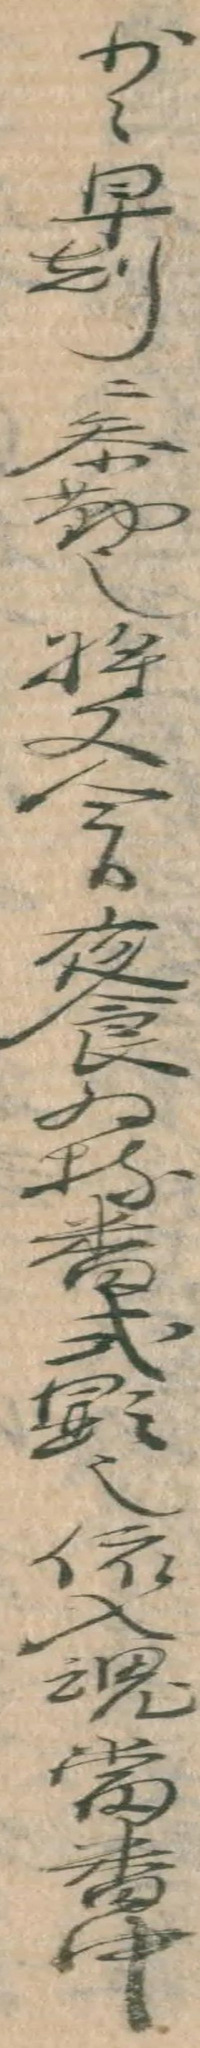少々早刻ニ参勤也将又今日夜食為持番式顕也依入魂當番中
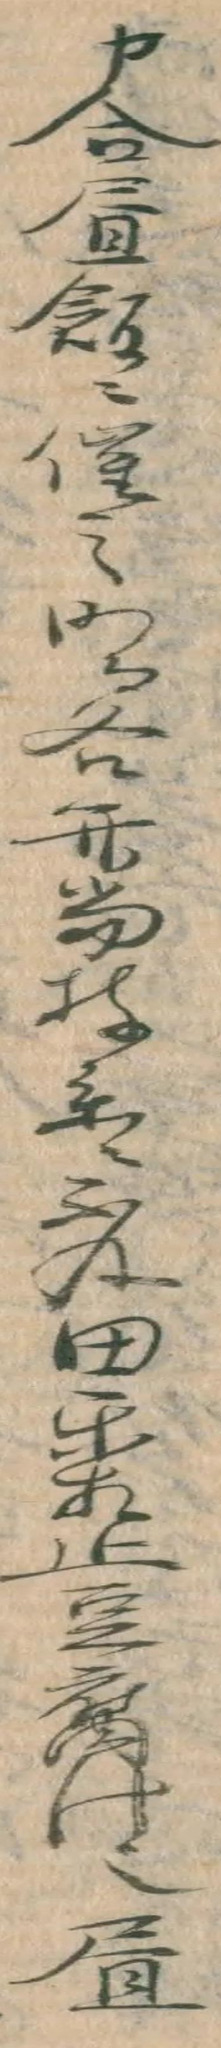申合昼飯に催之仍而各弁当持参ニ不及田楽相止豆腐汁之昼
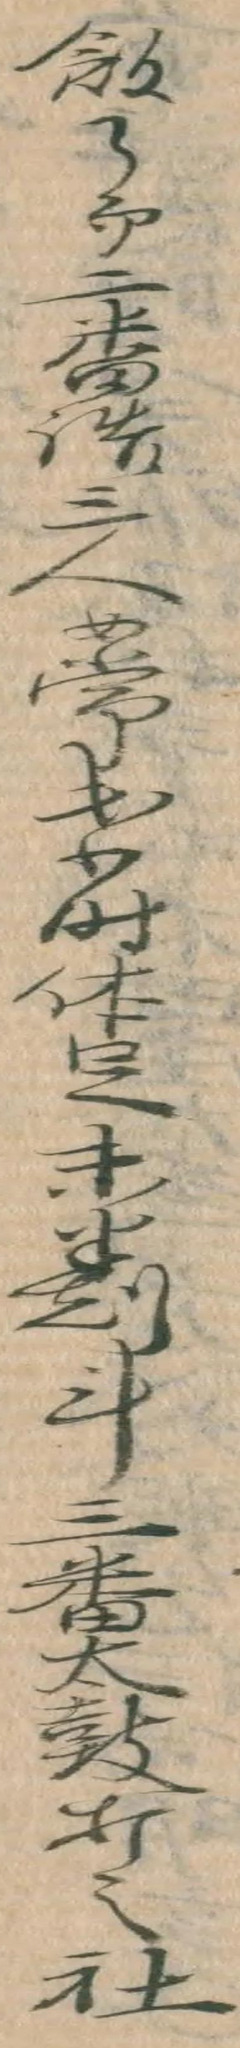飯了二番詰三人如常義小時休足未半刻斗三番太鼓打之社
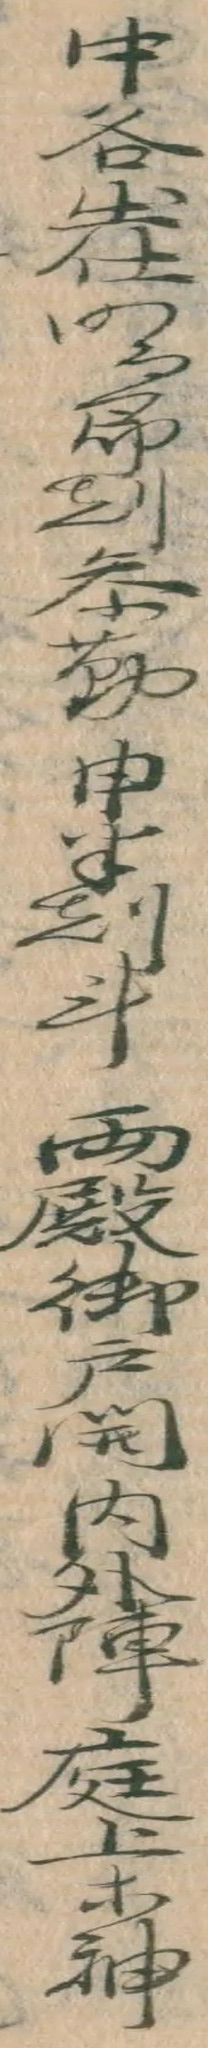中谷出仕仍而即刻参勤申半刻斗両殿御戸開内外陣庭上等神
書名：賀茂社記録. 第65冊
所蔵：国立国会図書館 National Diet Library, JAPAN
